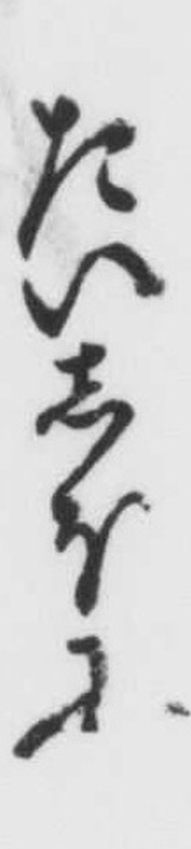たいしほに
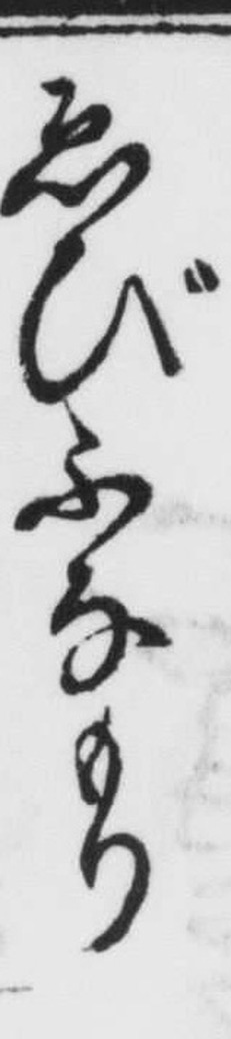ゑびふなもり汁
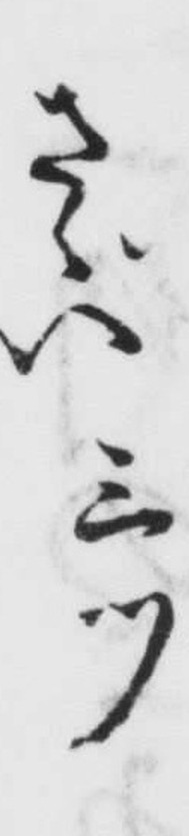さゝい三ツ
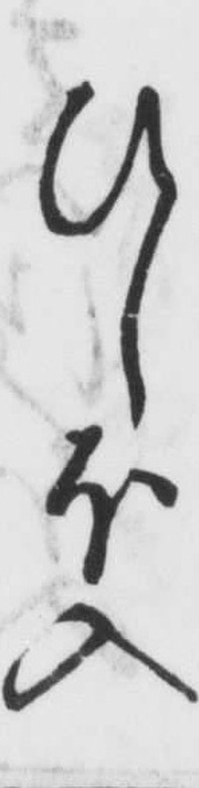ひしほ入
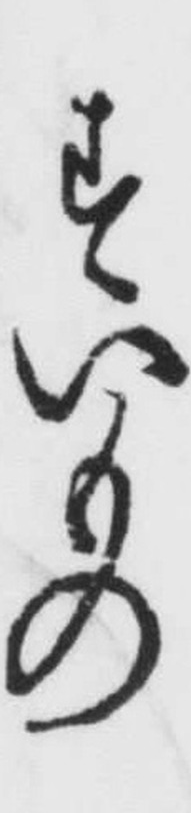すいもの
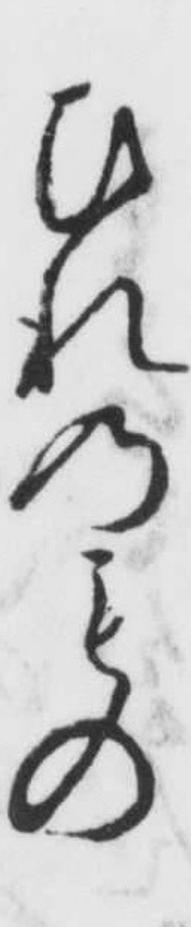ひれのもの
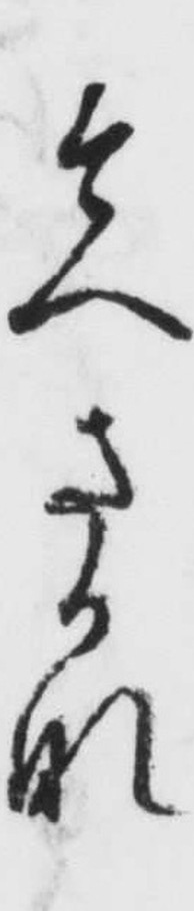そへさかな
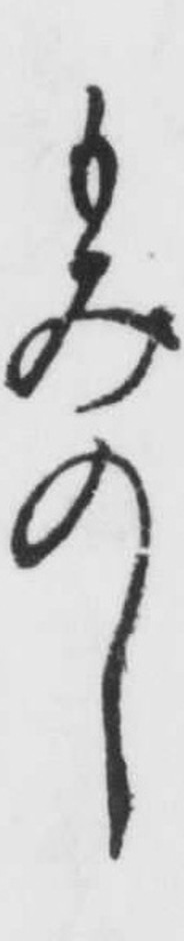もみのし
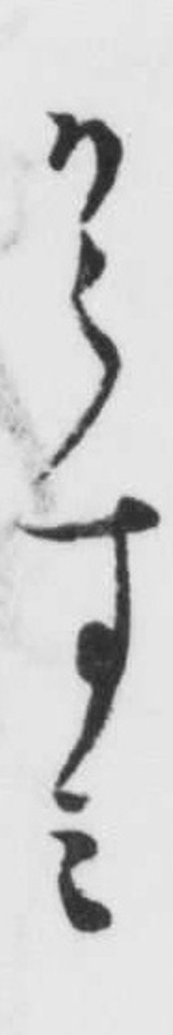からすミ
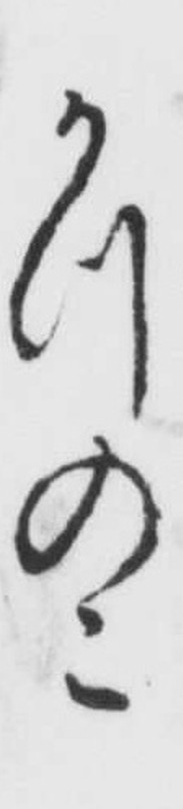かづのこ
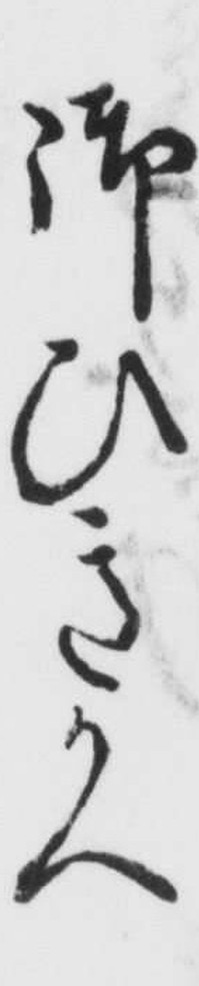御ひきかへ
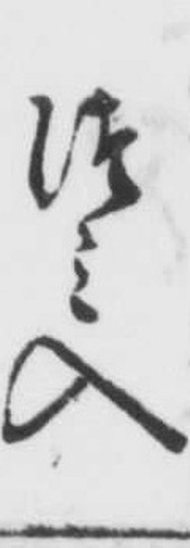つミ入
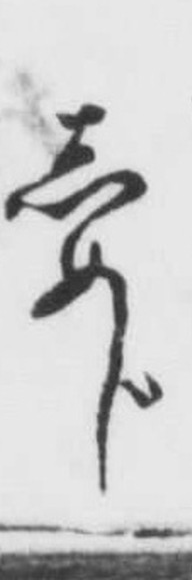しめじ
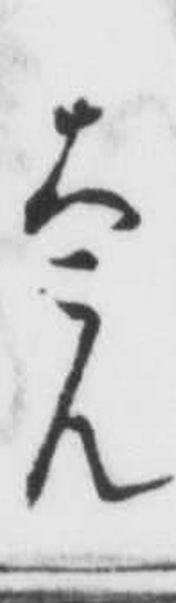大こん
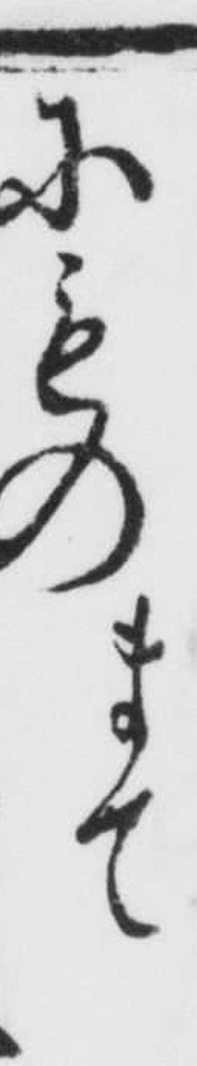にものまて
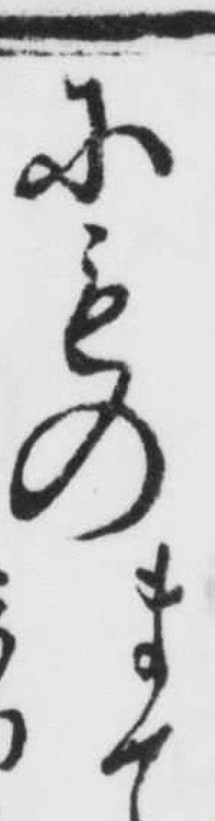にものまて
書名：料理切形秘伝抄
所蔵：大阪府立大学学術情報センター 国文学研究資料館
